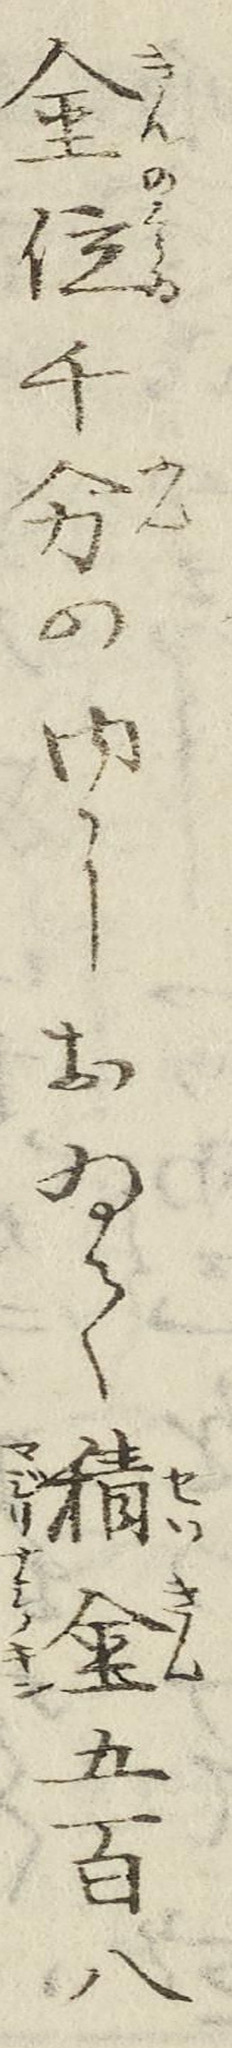金位千分の内におゐて精金五百八
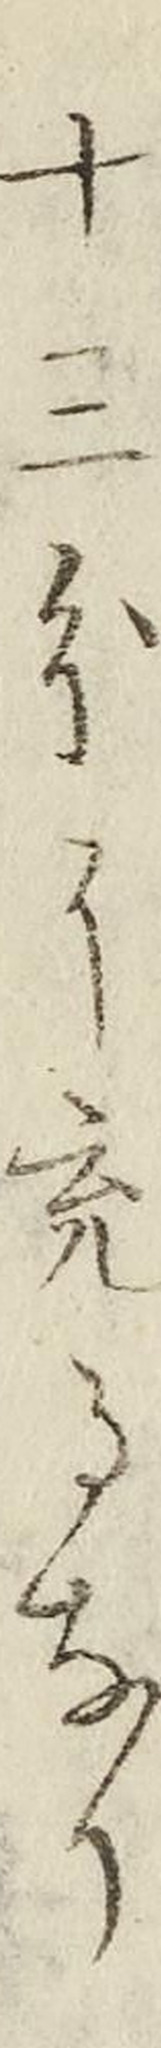十三分に充るなり
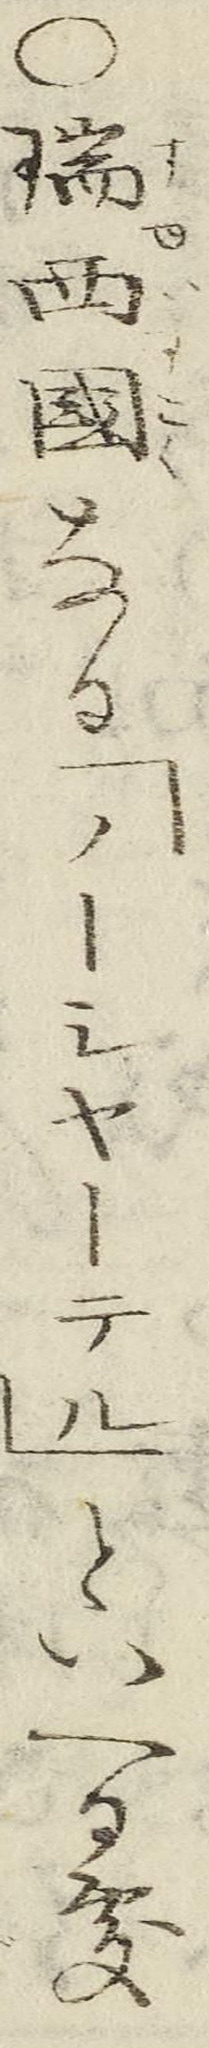○瑞西国なる「ノーシヤーテル」といへる処
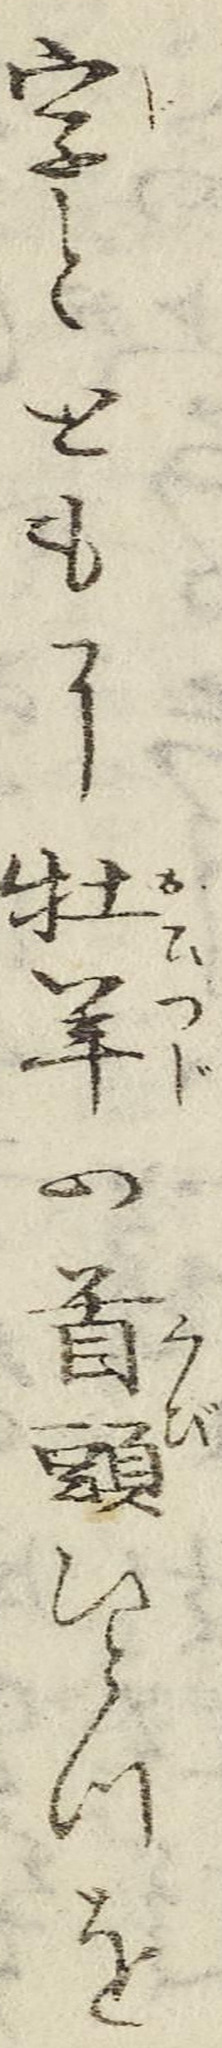字とともに牡羊の首頭ひとつを
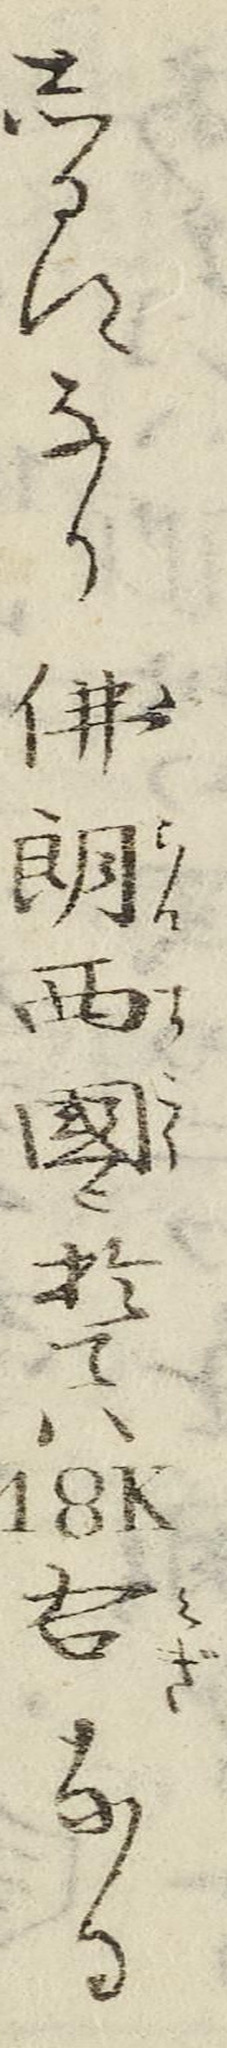しるすなり仏朗西国に於ては１８Ｋ右なる
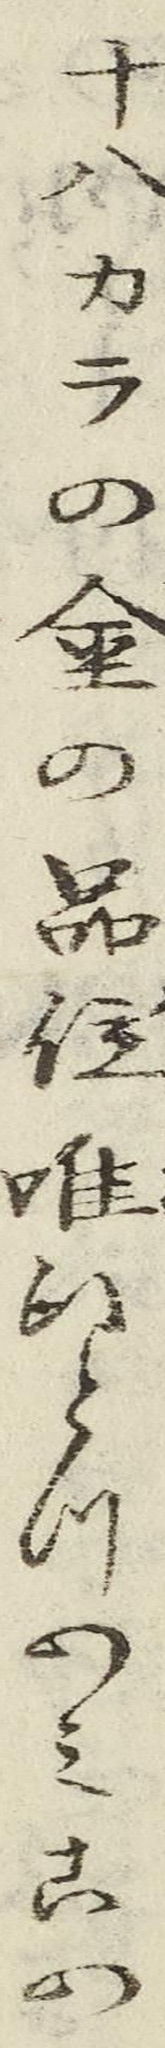十八カラの金の品位唯ひとつのみこの
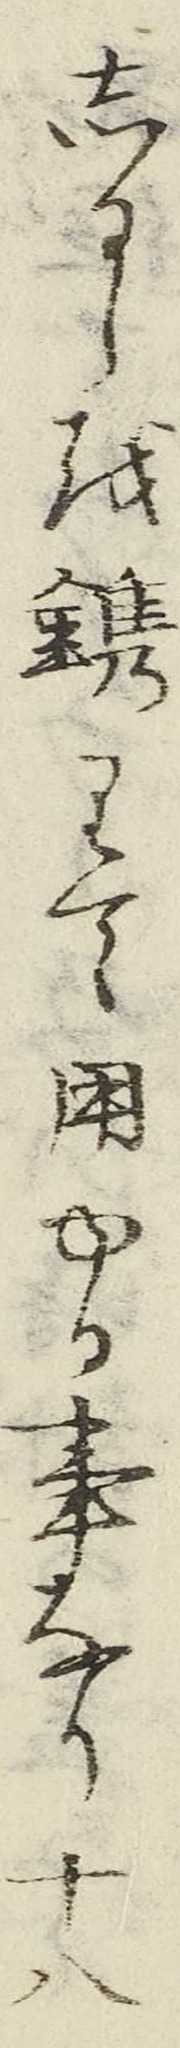しるしを鎸りて用ゆる事なり十八
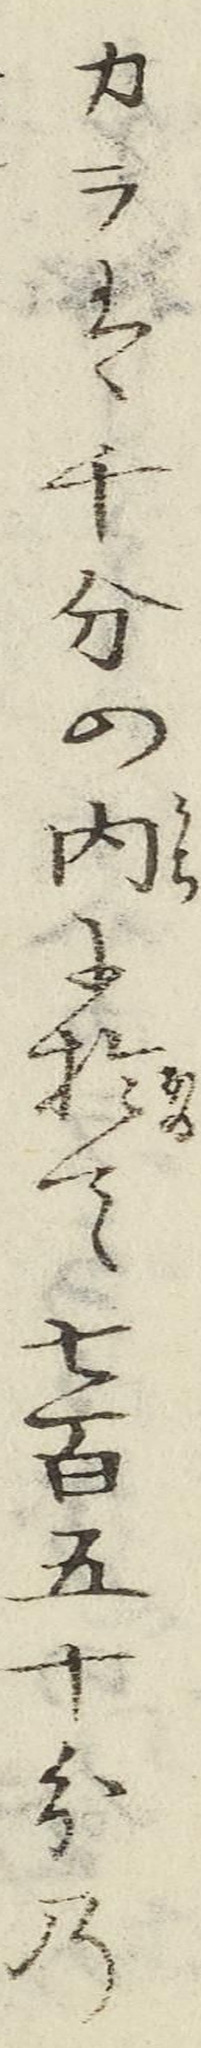カラは千分の内に於て七百五十分の
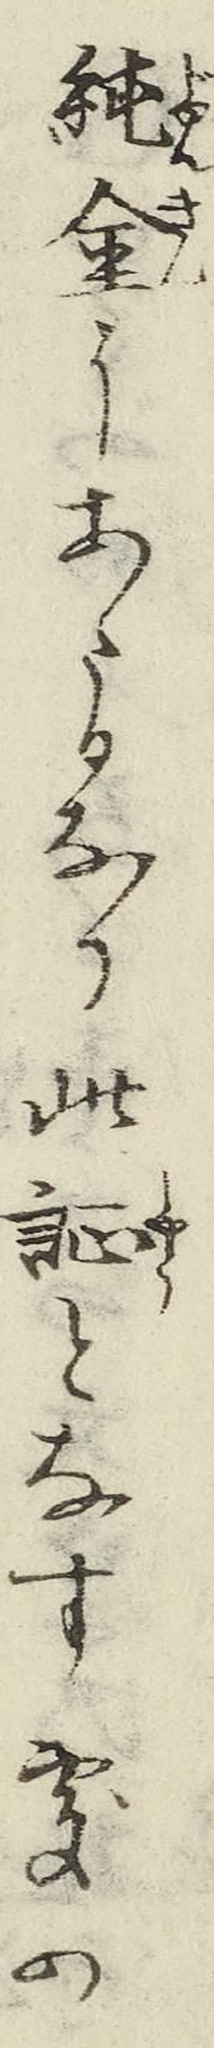純金にあたるなり此証となす処の
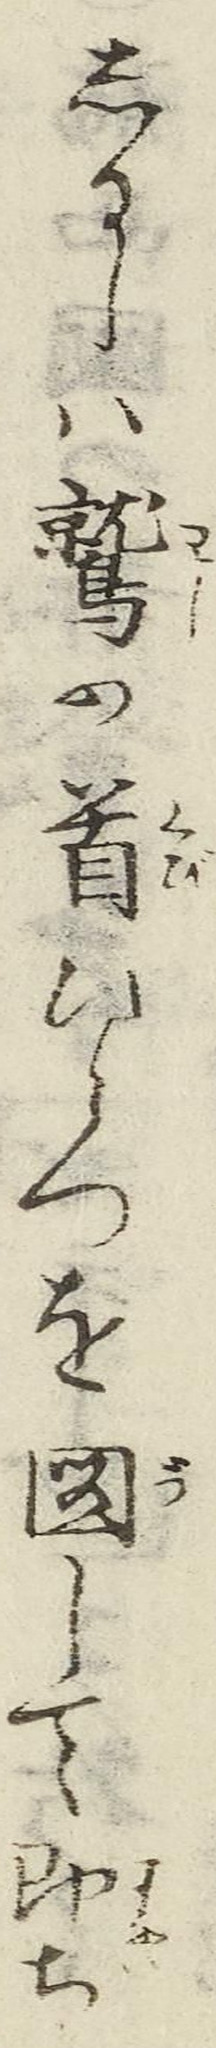しるしは鷲の首ひとつを図して即ち
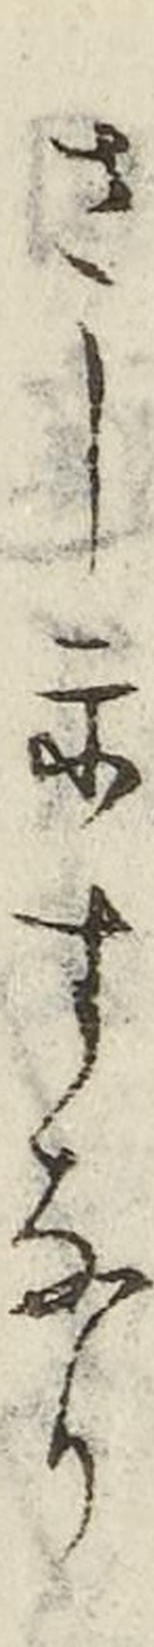さし示すなり
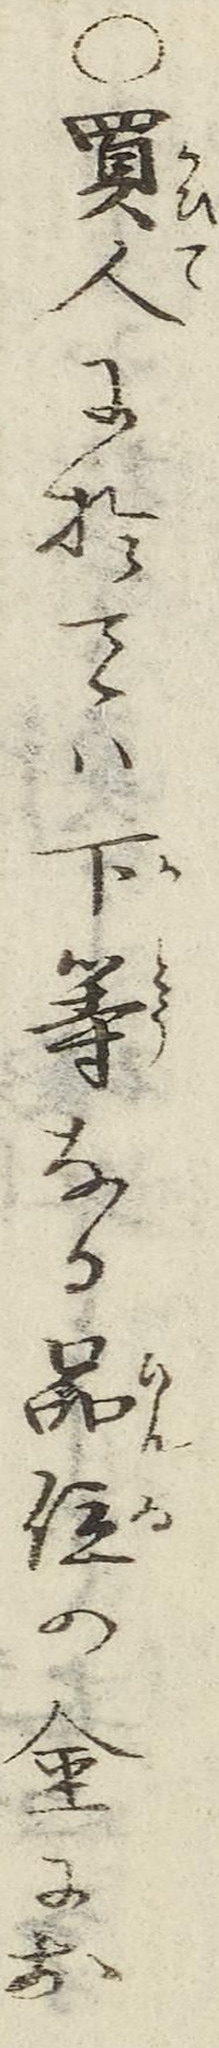○買人に於ては下等なる品位の金にお
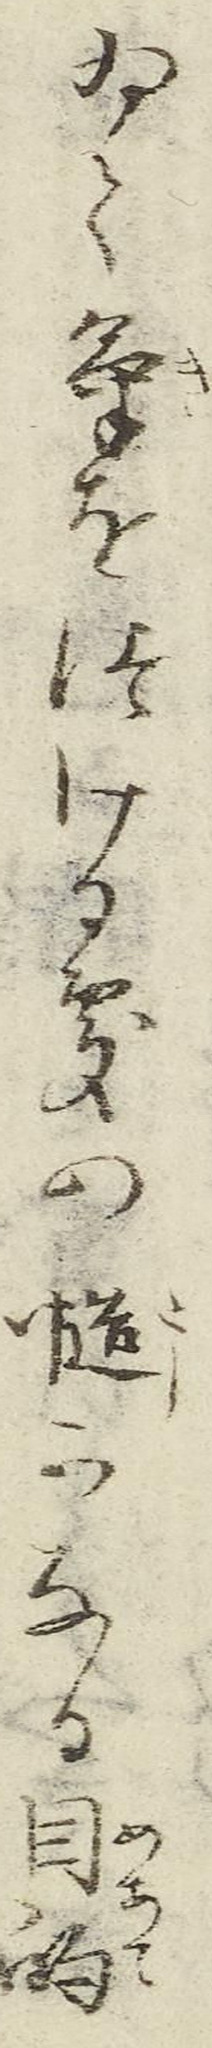ゐて気をつける処の慥かなる目的
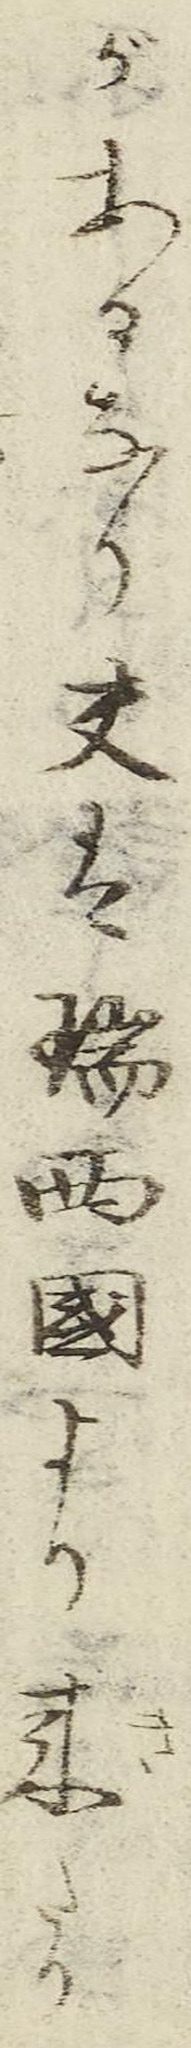があるなり夫は瑞西国より来たり
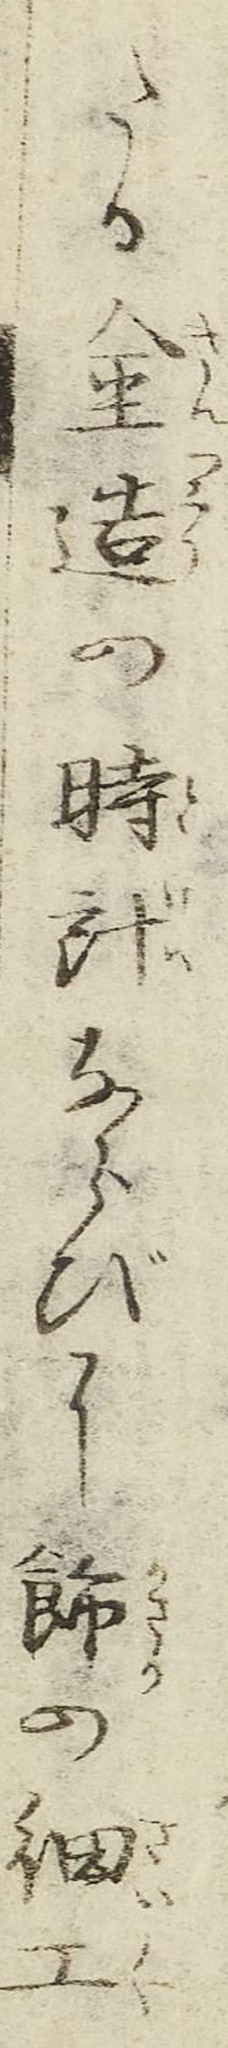たる金造の時計ならびに飾の細工

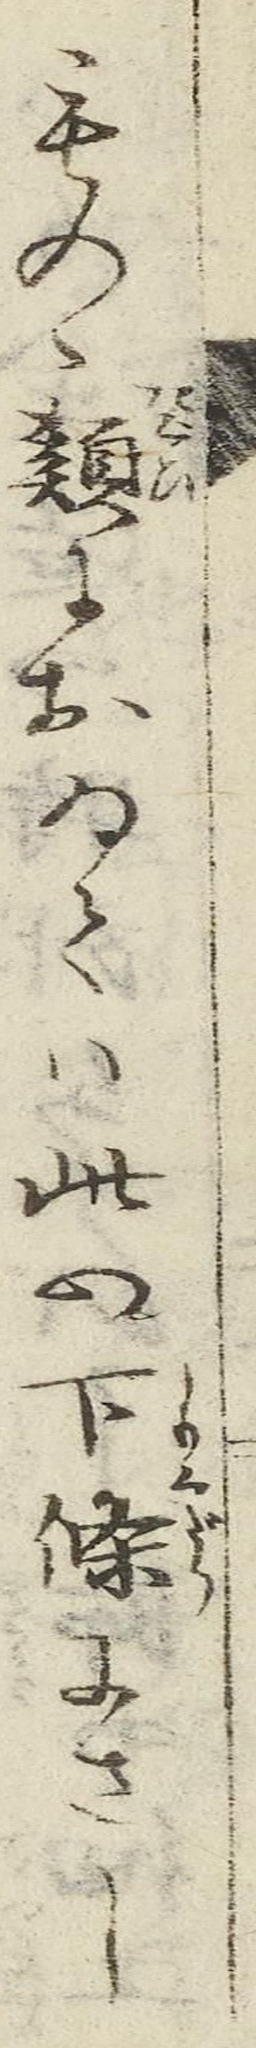ものゝ類におゐては此の下條にさし
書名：[時計に関する冊子]
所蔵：東京大学地震研究所図書室 Earthquake Research Institute Library, The University of Tokyo, JAPAN
